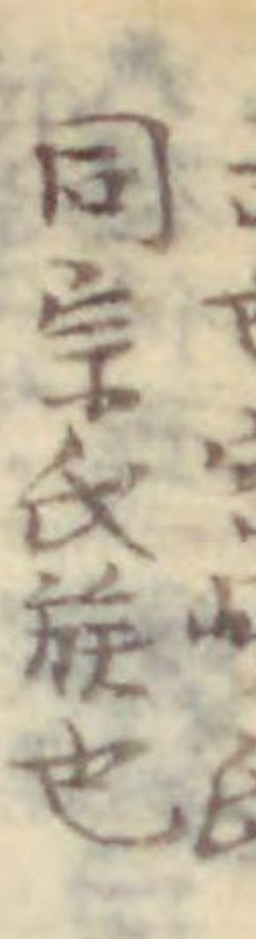同宗氏族也
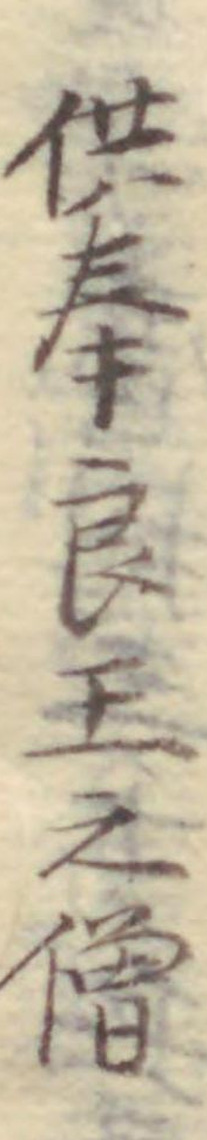供奉良王之僧
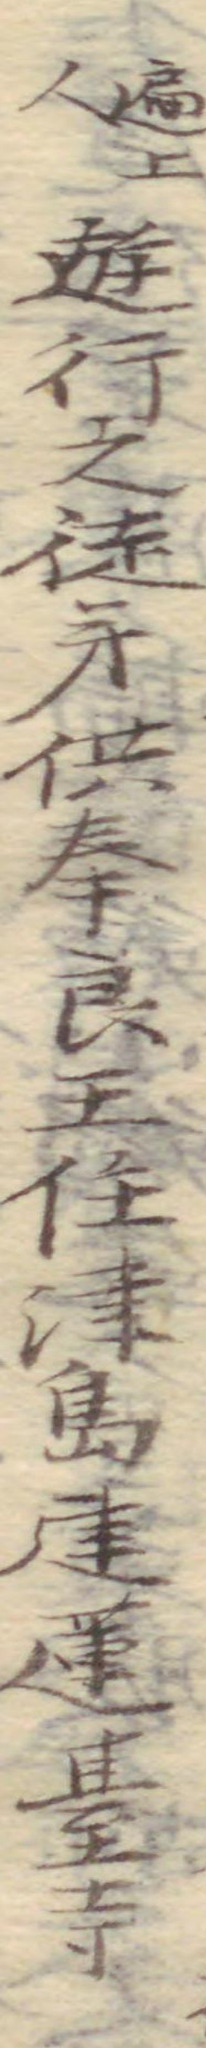遍上人遊行之徒第供奉良王住津島建蓮台寺
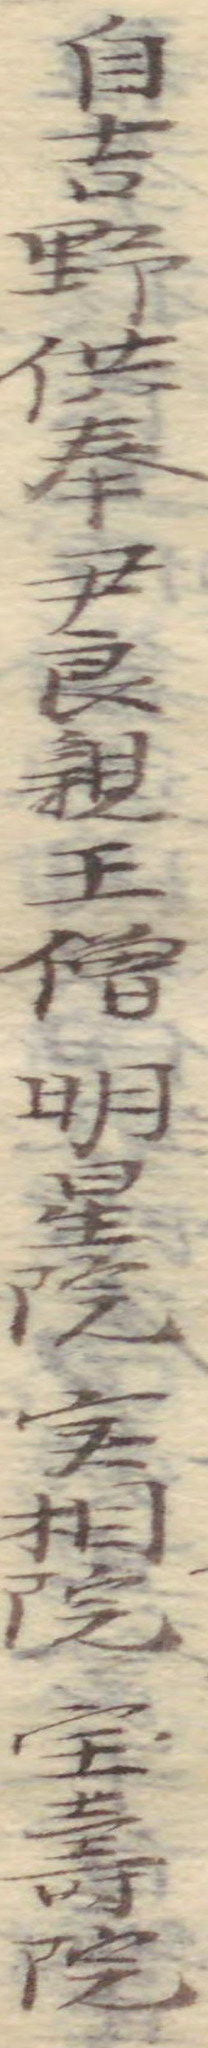自吉野供奉尹良親王僧明星院実相院宝寿院
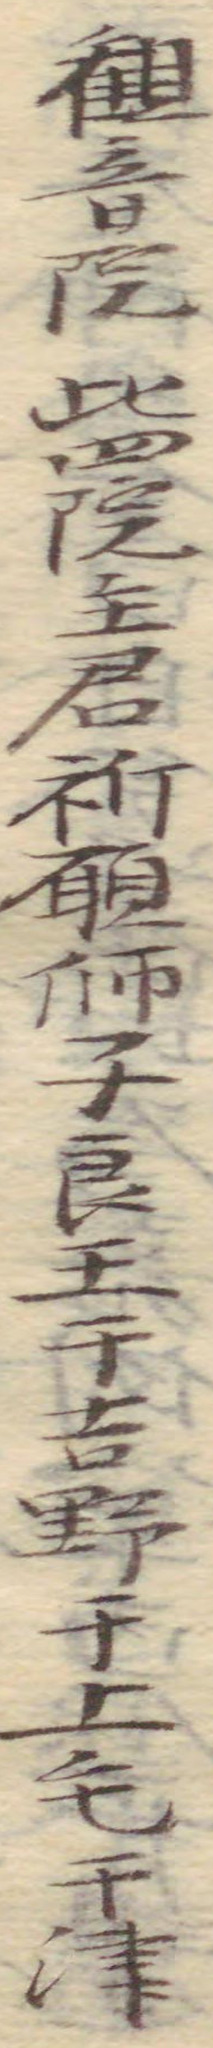観音院此四院主君祈願師子良王于吉野于上毛于津
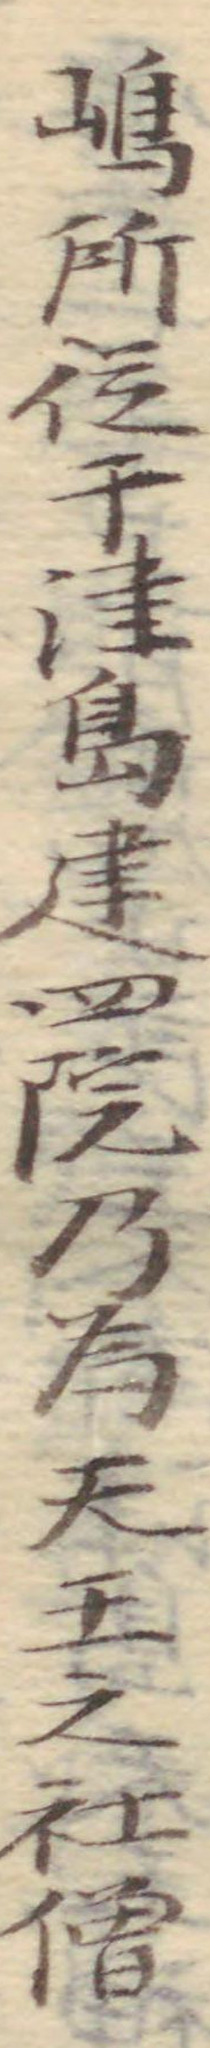嶋所従于津島建四院乃為天王之社僧
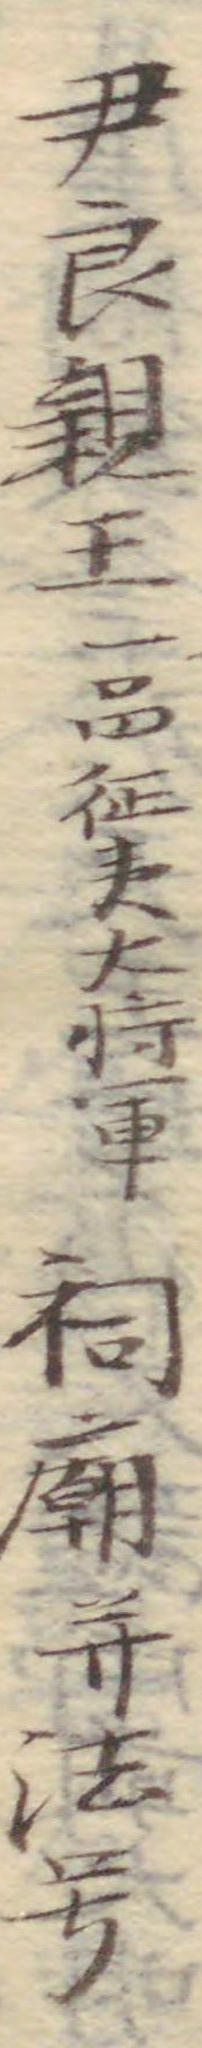尹良親王一品征夷大将軍祠廟幷法号
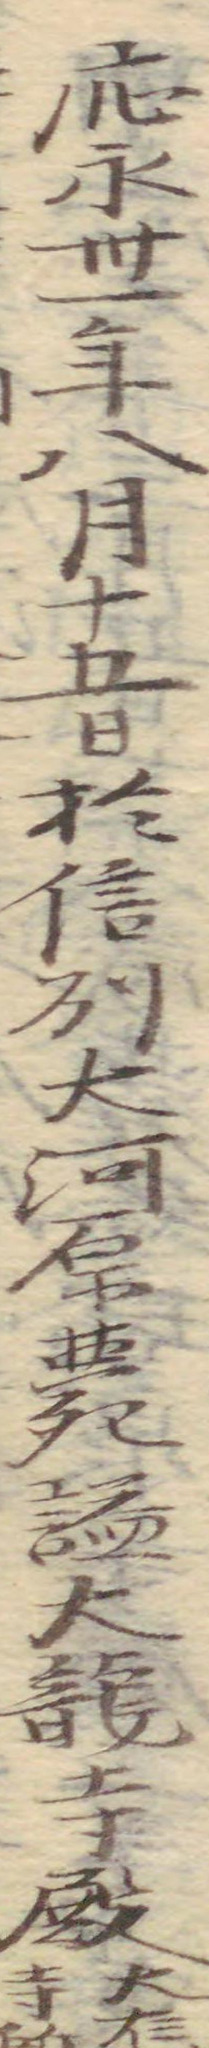応永卅一年八月十五日於信州大河原薨諡大龍寺殿大龍寺所

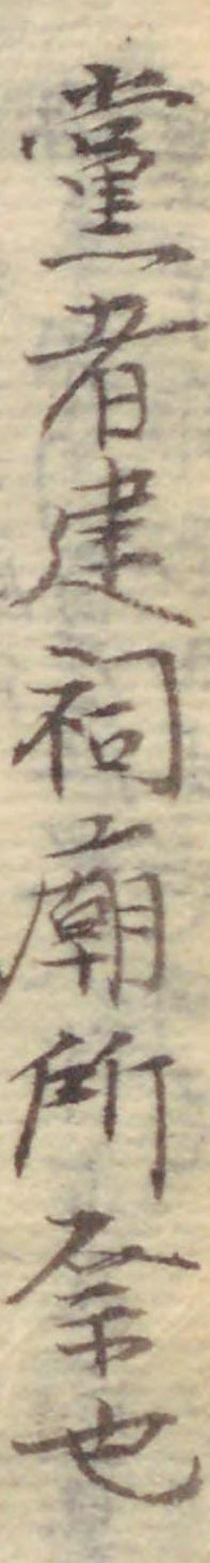党者建祠廟所祭也
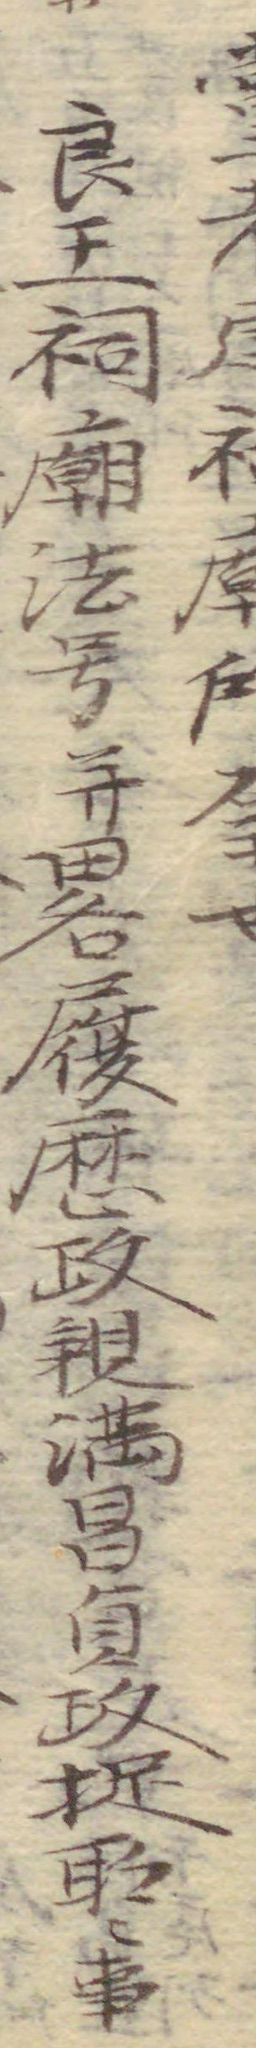良王祠廟法号幷略履歴政親満昌貞政捉取々事
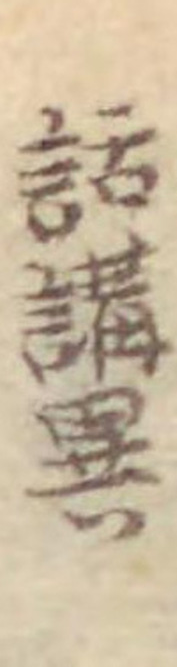話講異
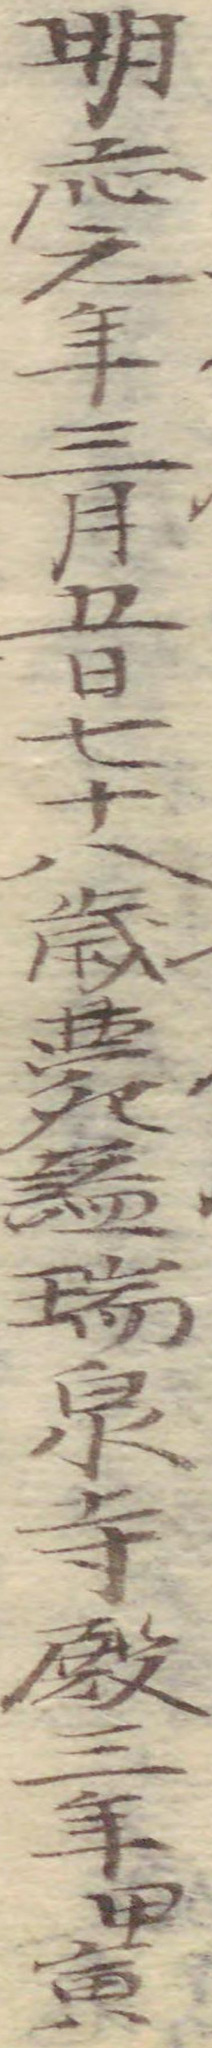明応元年三月五日七十八歳薨諡瑞泉寺殿三年甲寅
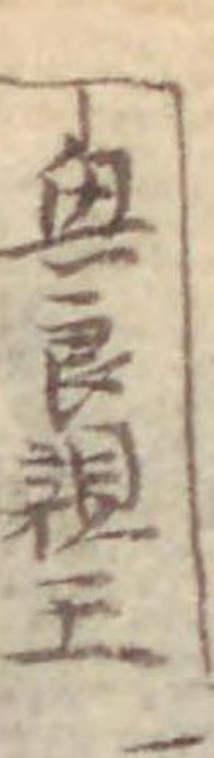興良親王
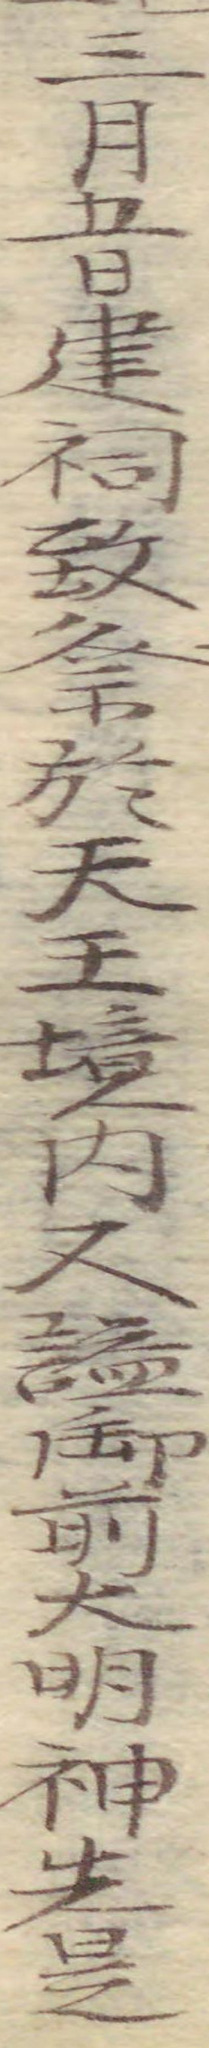三月五日建居祠致祭於天王境内又諡御前大明神先是
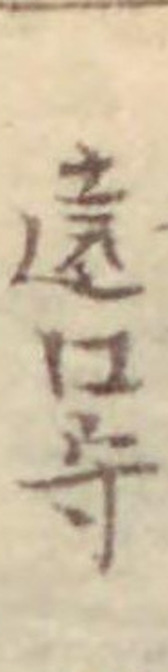遠江守
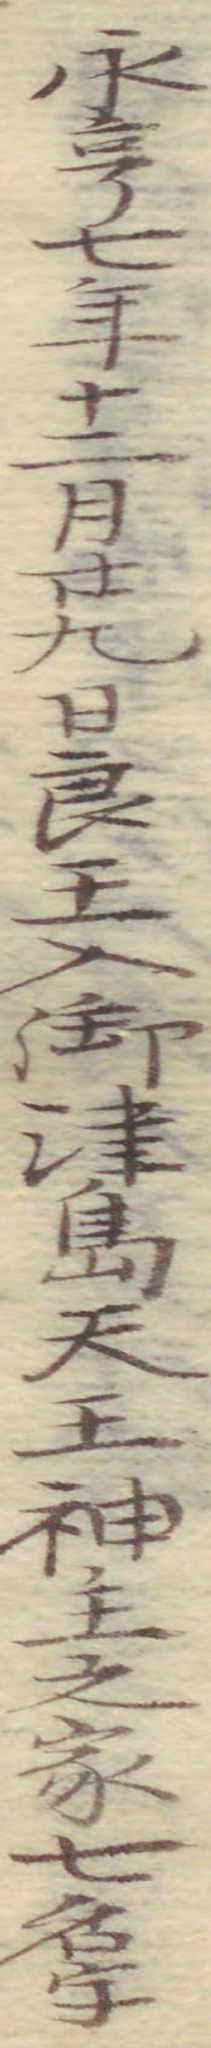永亨七年十二月廿九日良王入御津島天王神主之家七名字
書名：鶯宿雑記. 巻199-200
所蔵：国立国会図書館 National Diet Library, JAPAN
